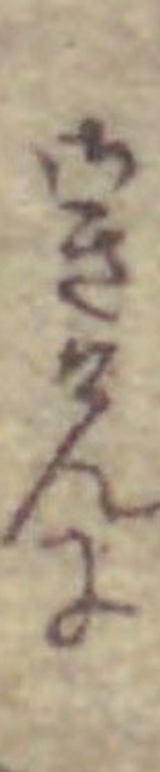御きけんに
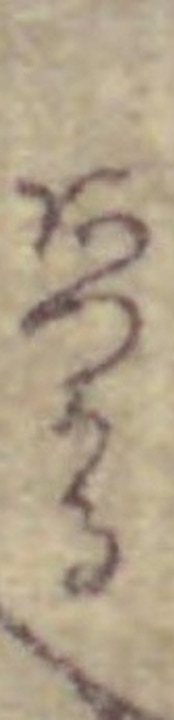あつかる

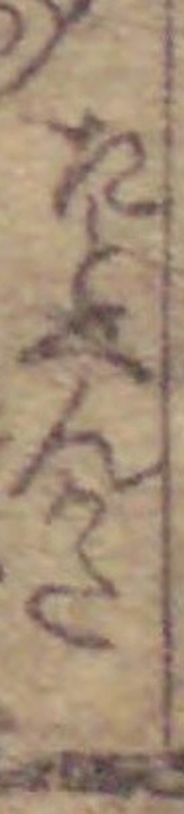たとへんかた
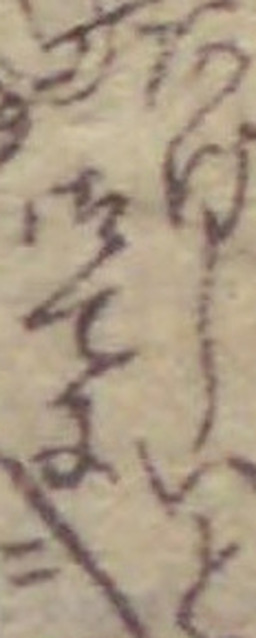御てに
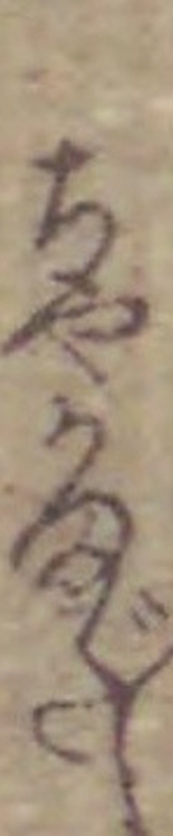ちやかまだ
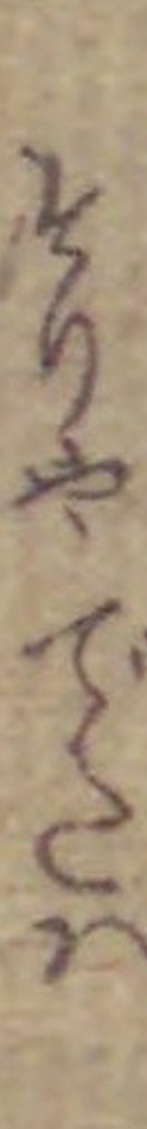そりやでたは

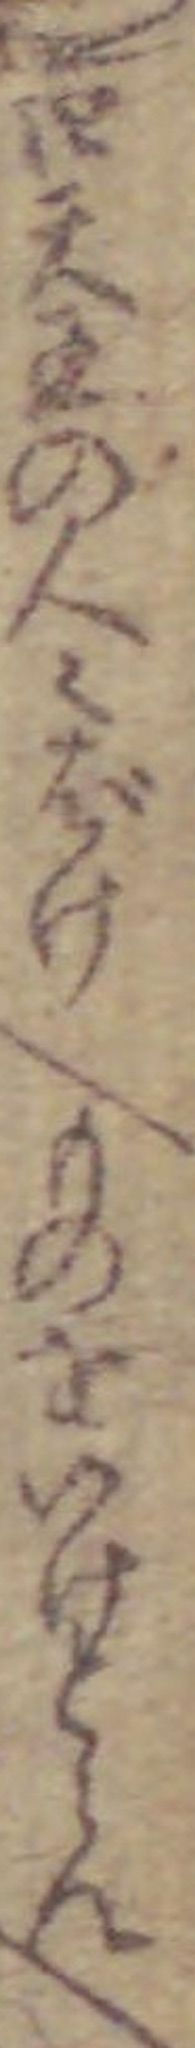四天王の人々ばけものをいけとらん
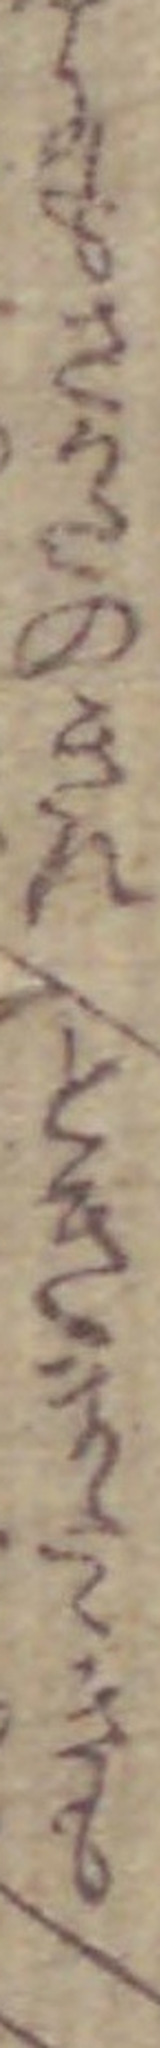中にもさかたのきんときまたゝきも

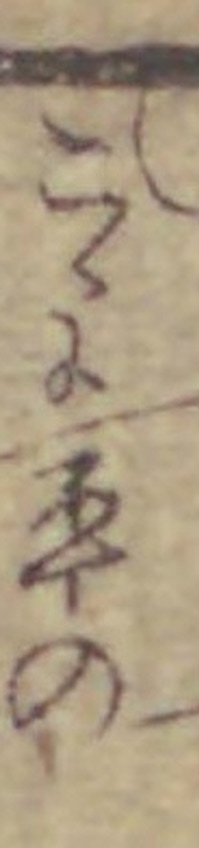こゝに平の
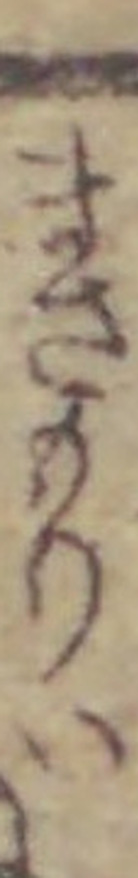まさもりは
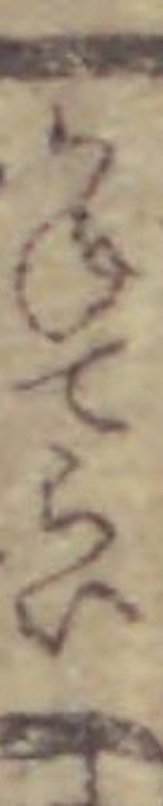かねてらい
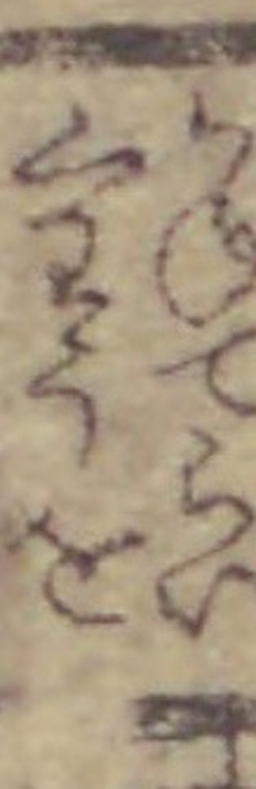くわうを
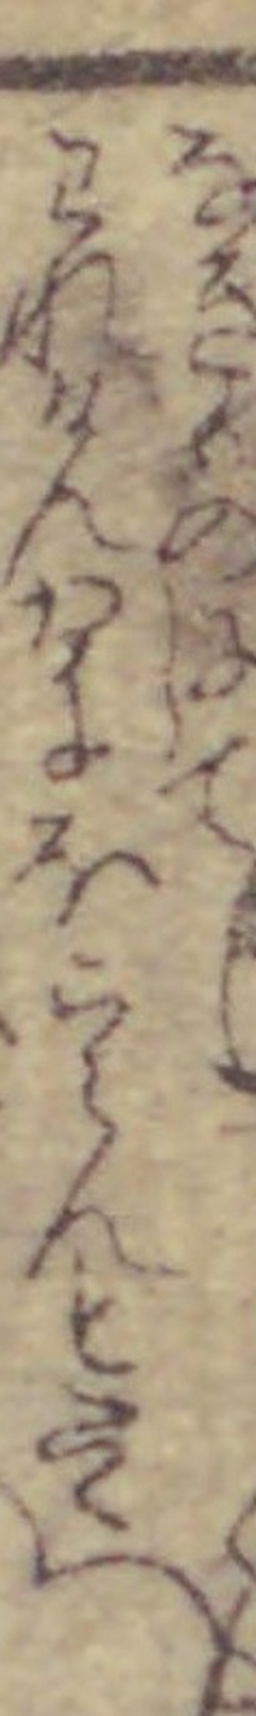われけんはにならんとたく
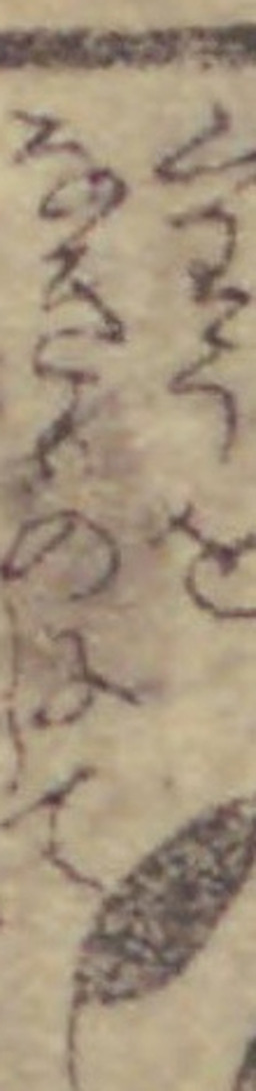なきものにして
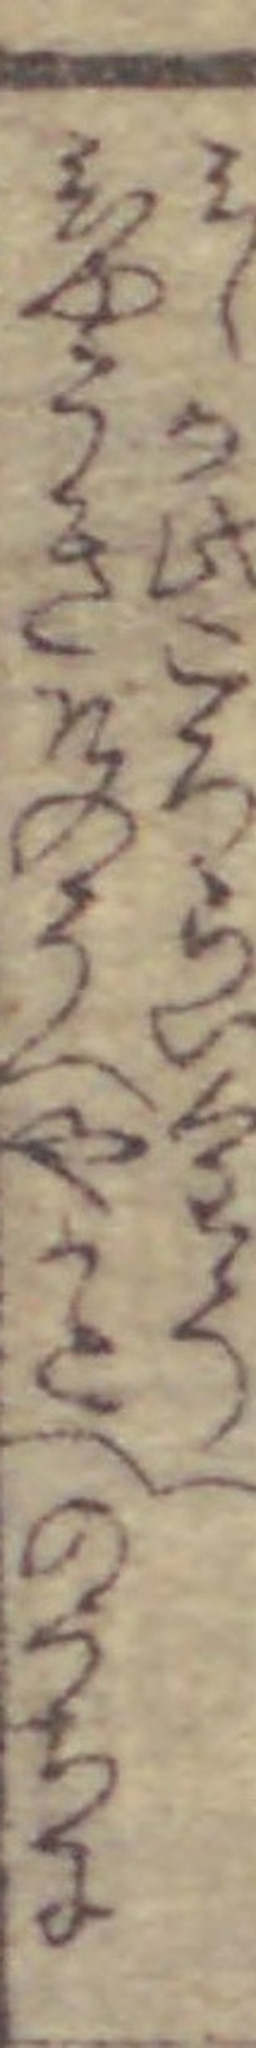ひやうきそのうへやかたのうちに
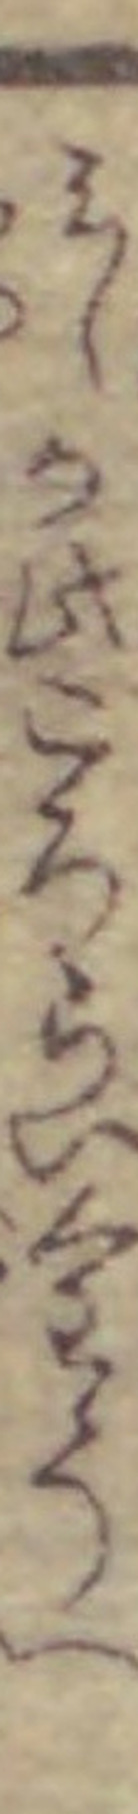みしか此ころらいくわう
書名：とんだ茶釜 2巻
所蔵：国立国会図書館 National Diet Library, JAPAN
